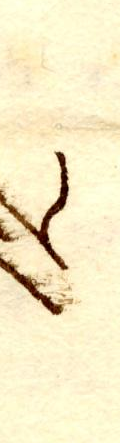12
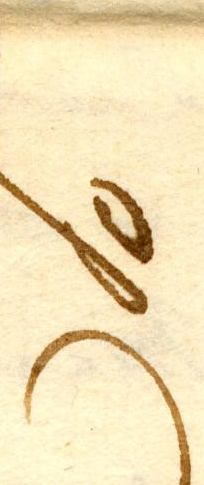To
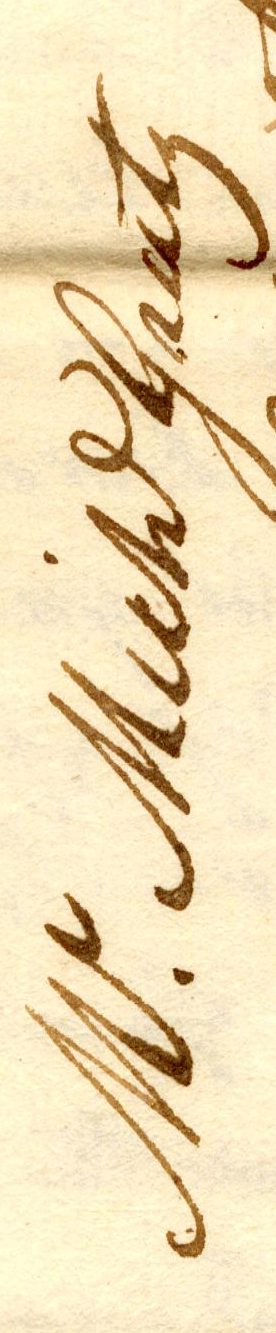M^r Mich^l Gratz
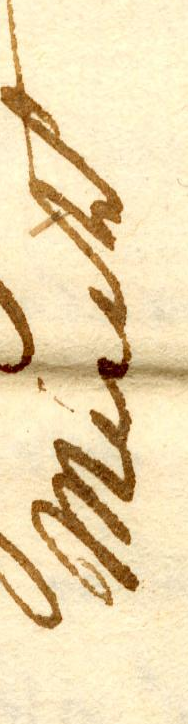Merch^t
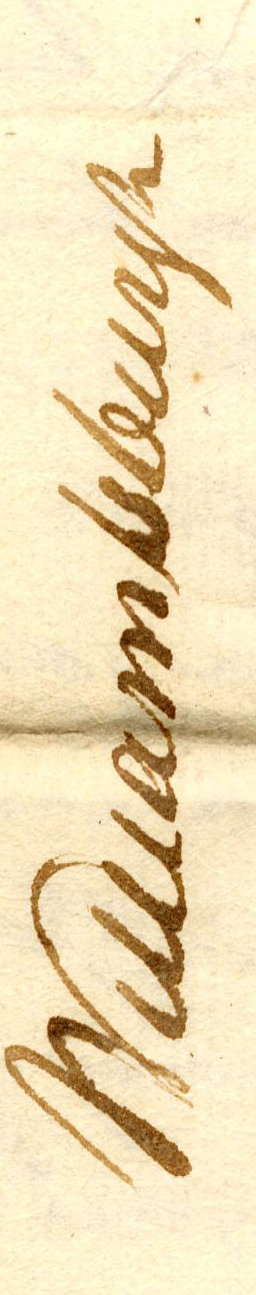Williamsburg
